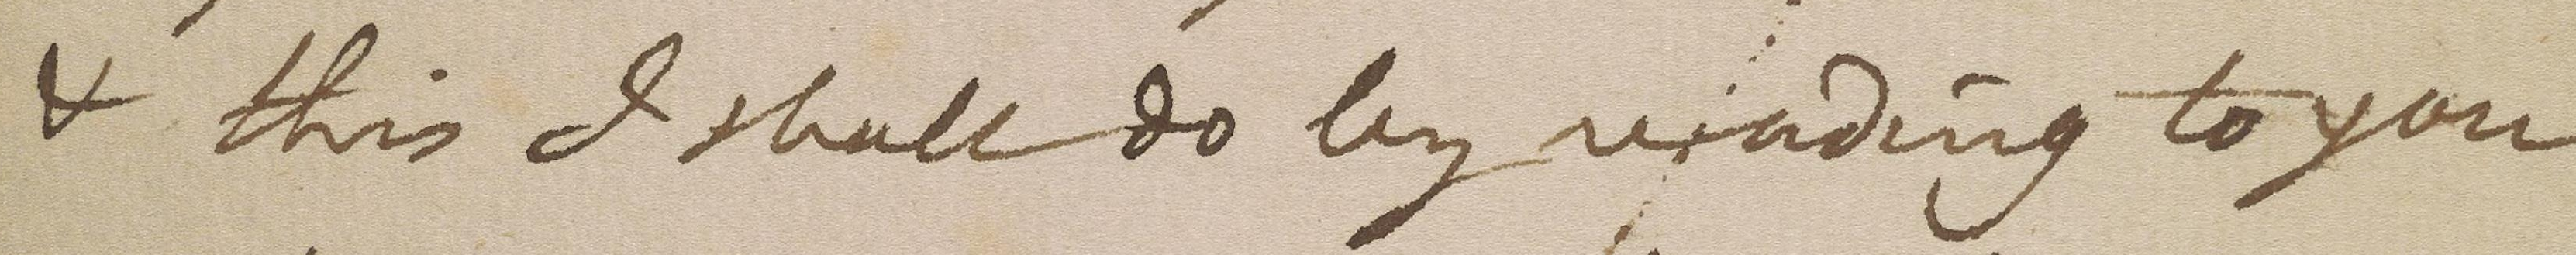& this I shall do by reading to you
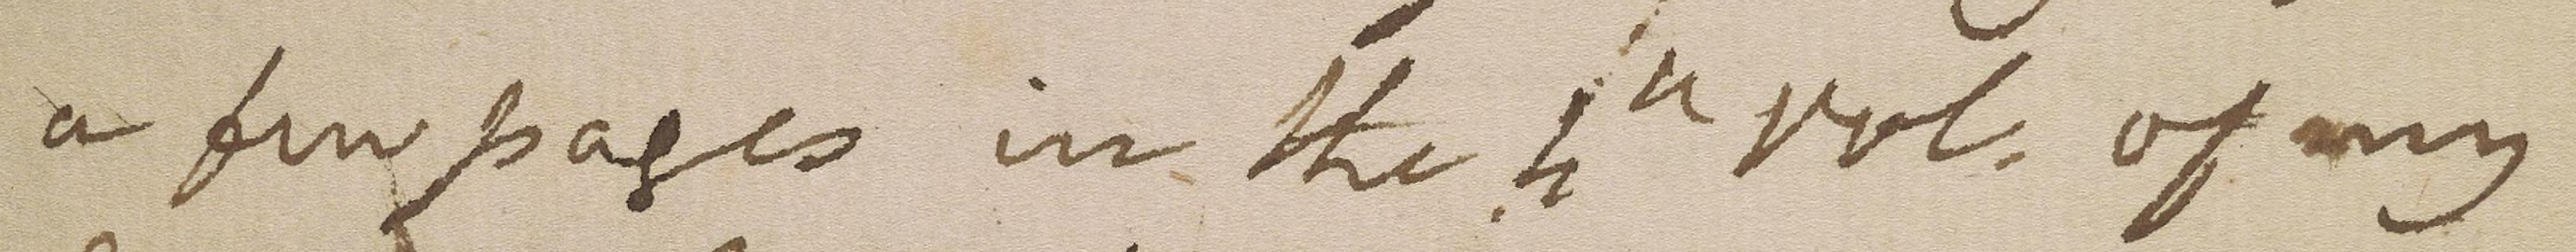a few pages in the 4^th vol. of my
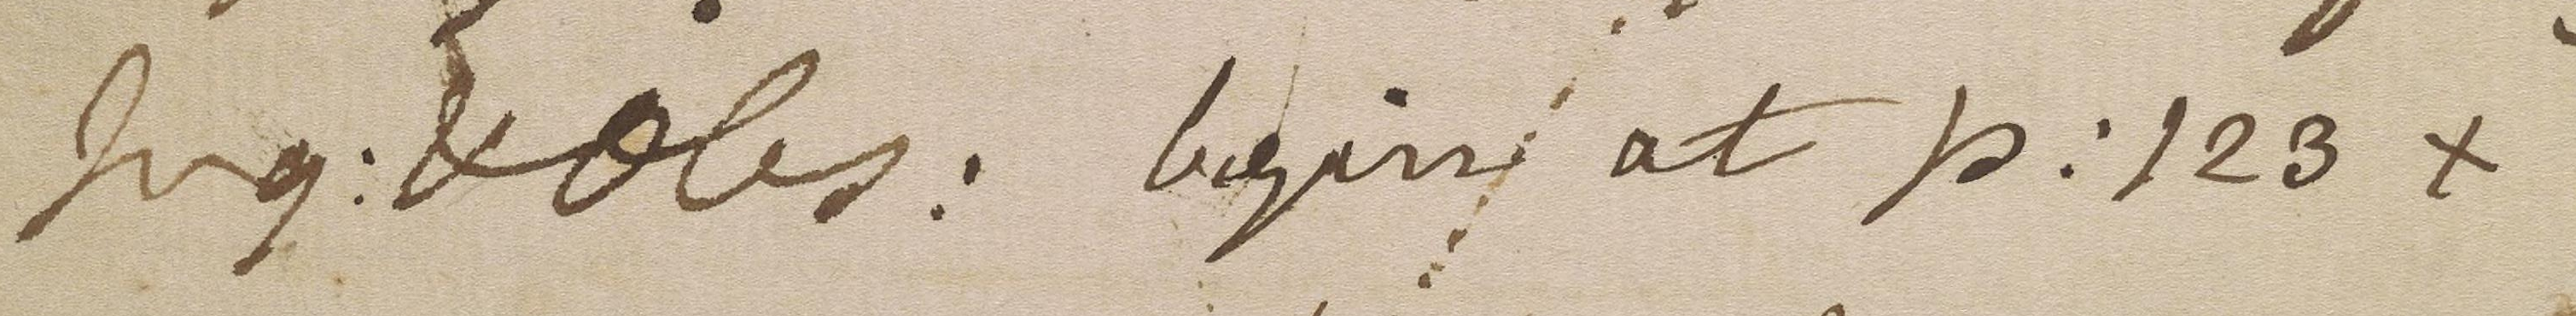Inq. Voles. begin at p. 123x
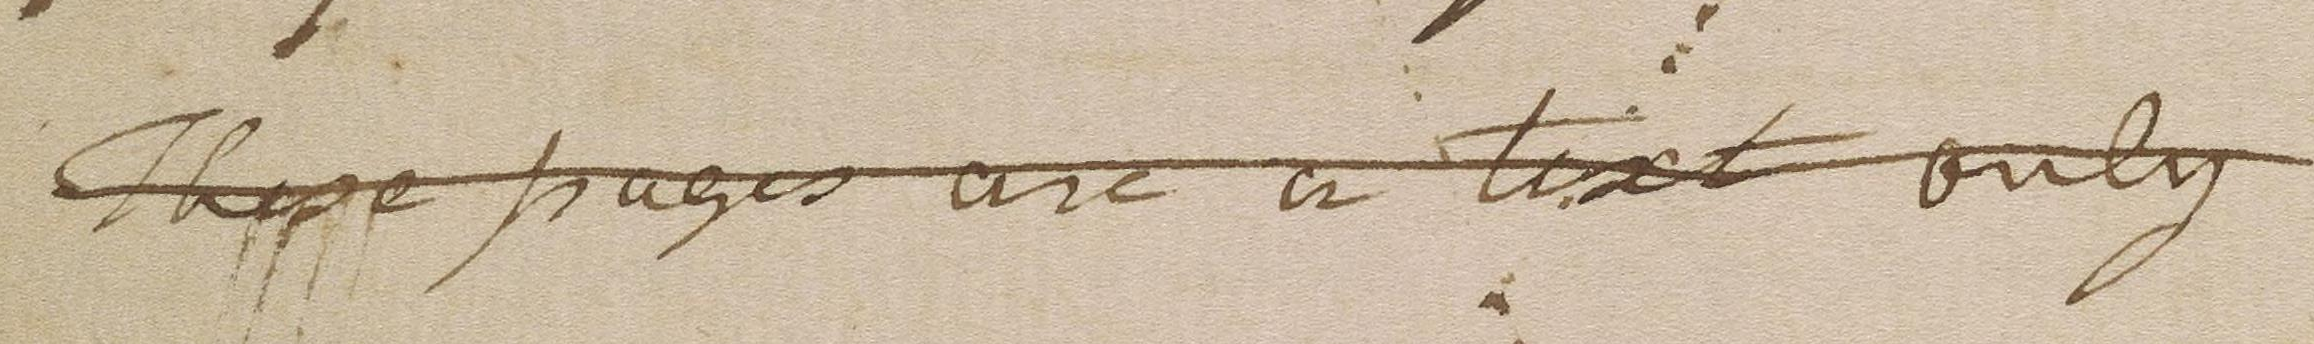[These pages are a text only]
